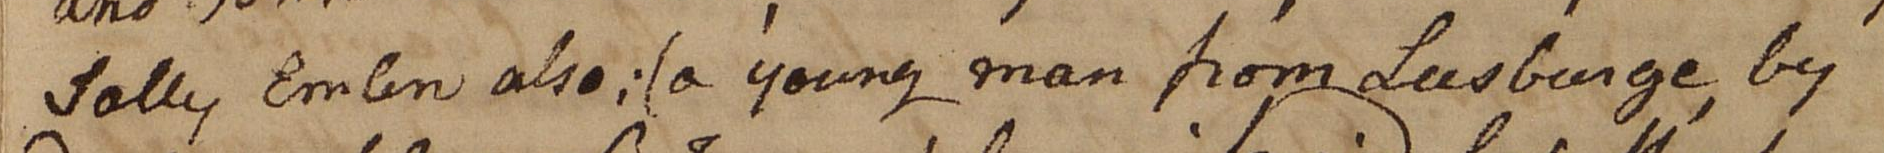Sally Emlen also; (a young man from Lusburge, by
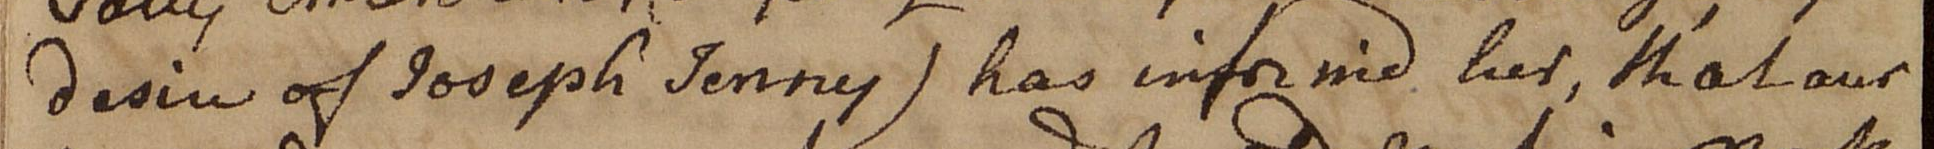desire of Joseph Jenny) has inform'd her, that our
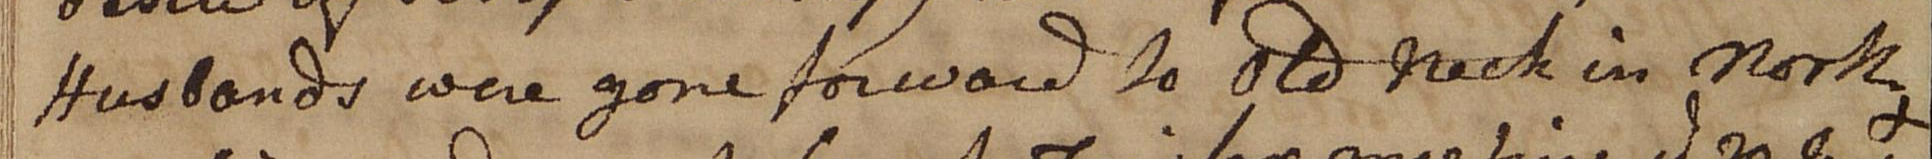Husbands were gone forward to Old Neck in North
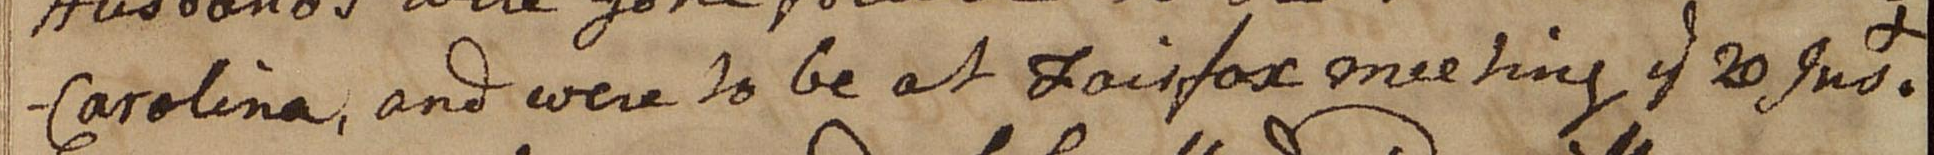-Carolina, and were to be at Fairfax meeting y^e 20 Jus^t.
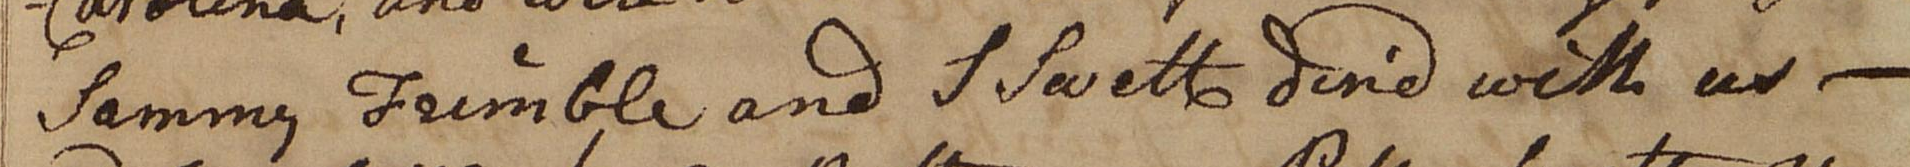Sammy Trimble and S Swett din'd with us-
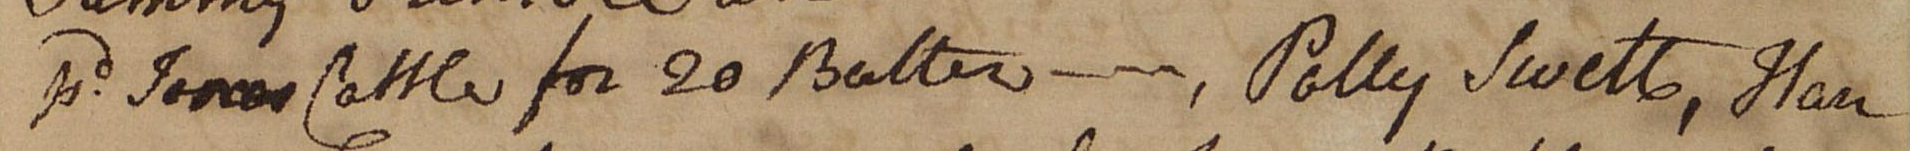p^d. Jones Cattle for 20 Butter-, Polly Swett, Han
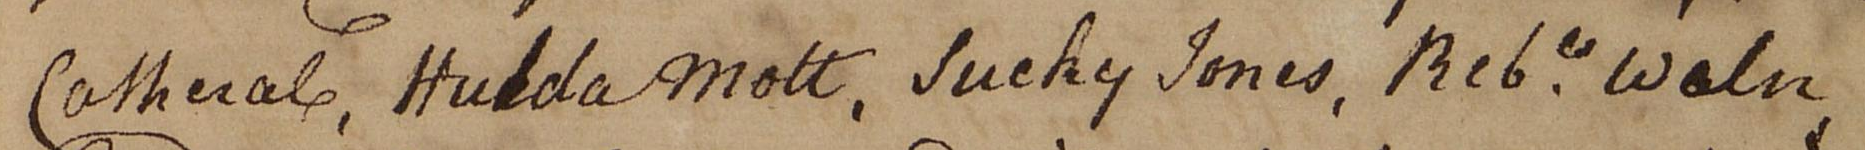Catheral, Hulda Mott, Suchy Jones, Reb^a. Waln
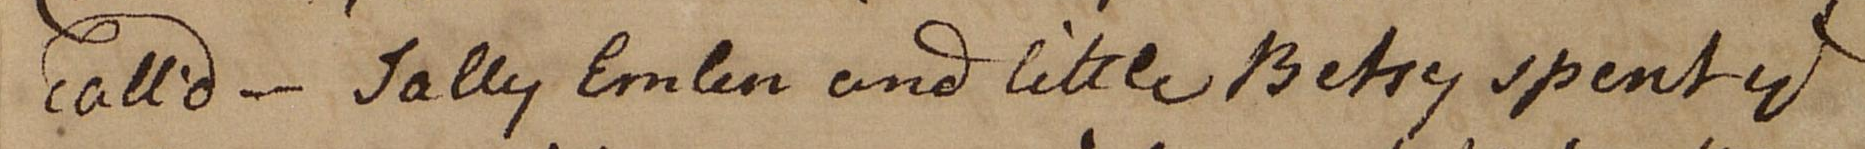call'd- Sally Emlen and little Betsy spent y^e
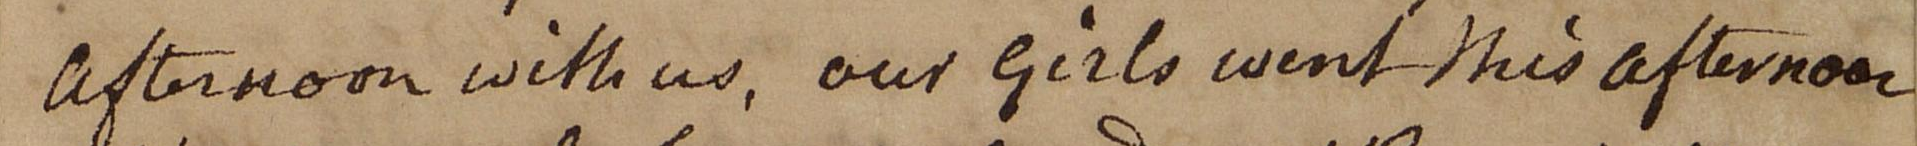afternoon with us, our Girls went this afternoon
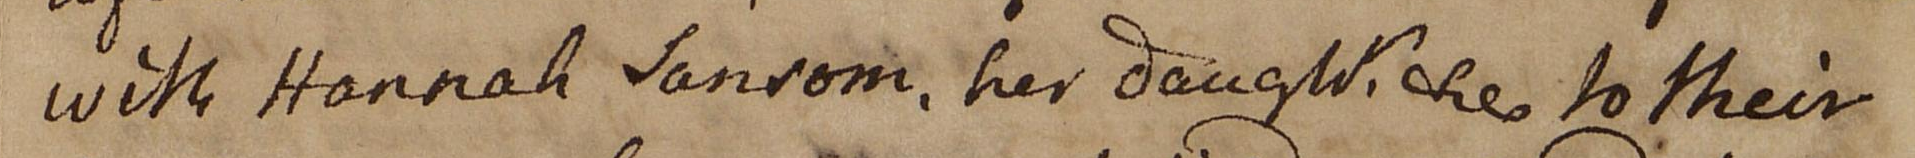with Hannah Sansom, her daugh^r. &c to their
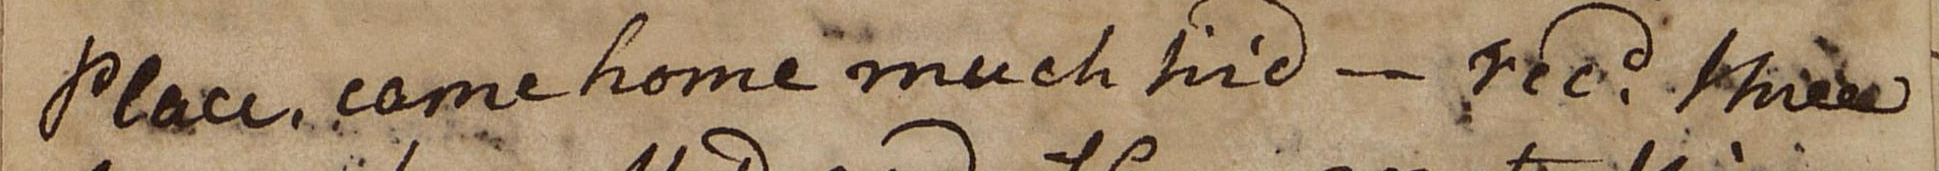Place, came home much tir'd- rec^d. three
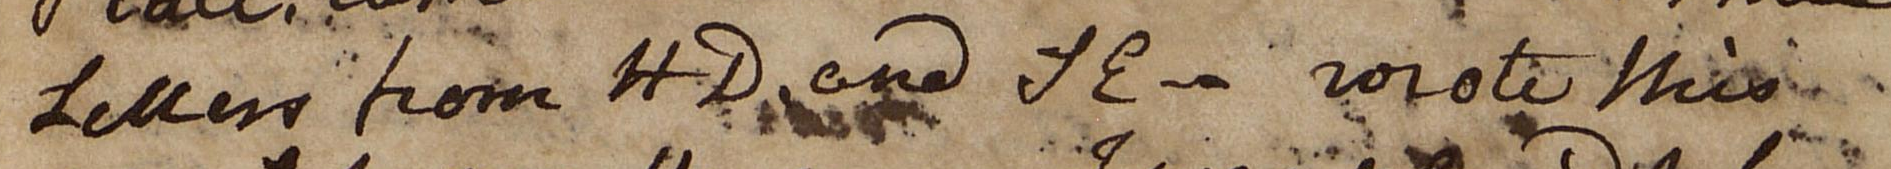Letters from HD. and SE- wrote this
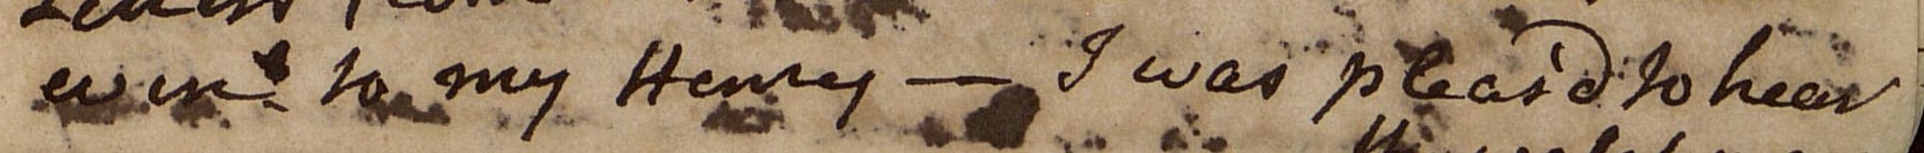even^g. to my Henry- I was pleas'd to hear
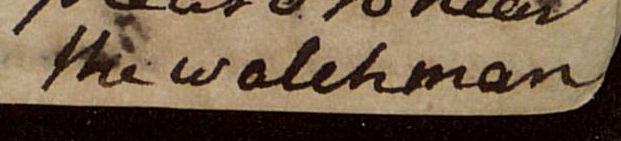the watchman
